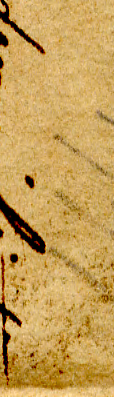1777
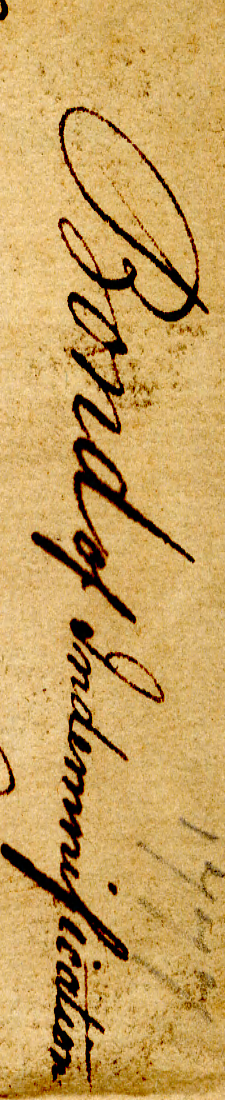Bond of Indemnification
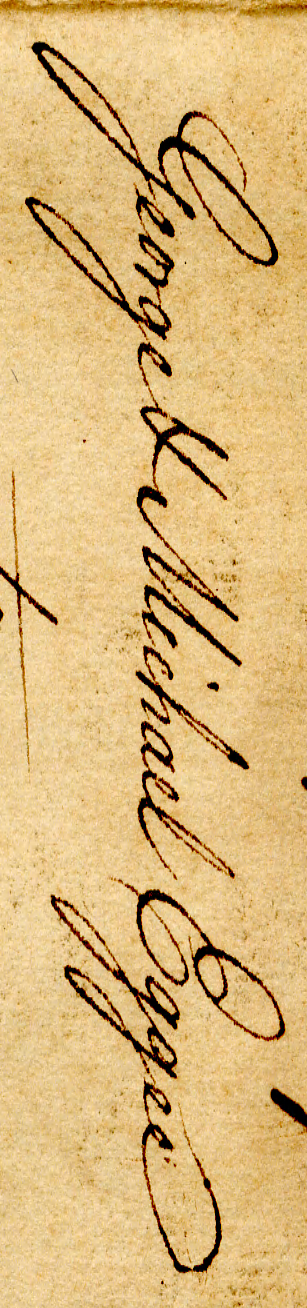George & Michael Eggee
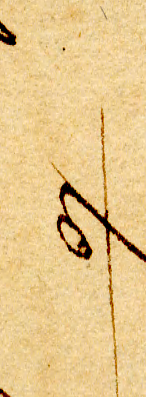to
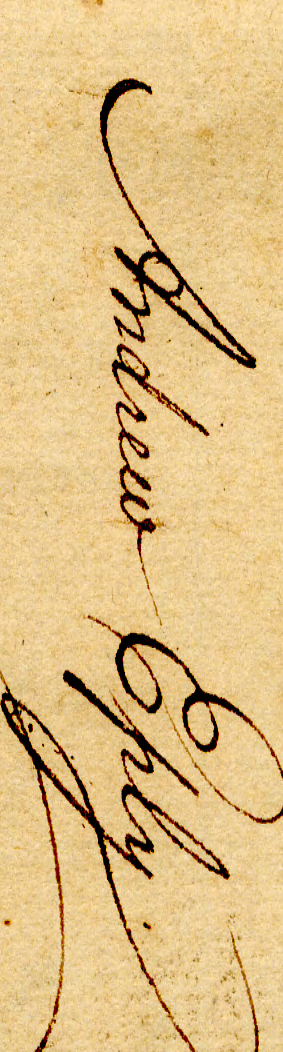Andrew Eply
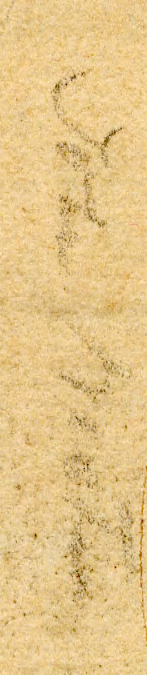John Wister
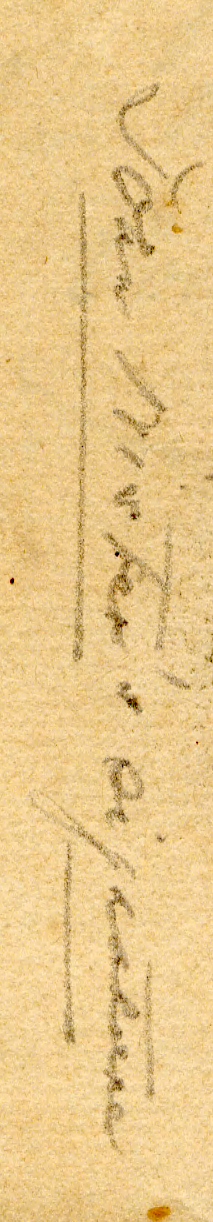John Wister's signature
